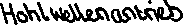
Hohlwellenantrieb
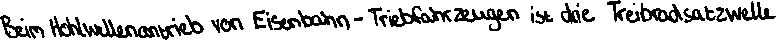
Beim Hohlwellenantrieb von Eisenbahn-Triebfahrzeugen ist die Treibradsatzwelle
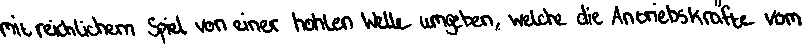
mit reichlichem Spiel von einer hohlen Welle umgeben, welche die Antriebskräfte vom
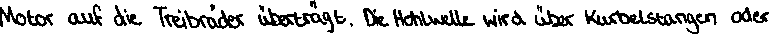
Motor auf die Treibräder überträgt. Die Hohlwelle wird über Kurbelstangen oder
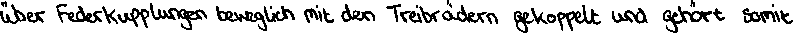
über Federkupplungen beweglich mit den Treibrädern gekoppelt und gehört somit
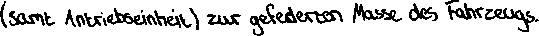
(samt Antriebseinheit) zur gefederten Masse des Fahrzeugs.
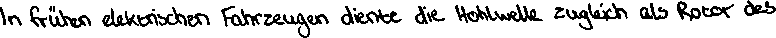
In frühen elektrischen Fahrzeugen diente die Hohlwelle zugleich als Rotor des
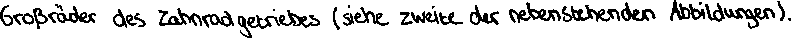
Großräder des Zahnradgetriebes (siehe zweite der nebenstehenden Abbildungen).
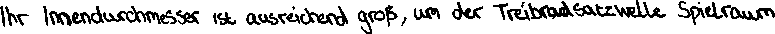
Ihr Innendurchmesser ist ausreichend groß, um der Treibradsatzwelle Spielraum
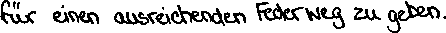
für einen ausreichenden Federweg zu geben.
